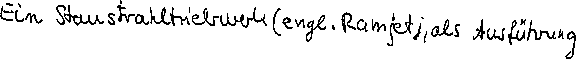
Ein Staustrahltriebwerk (engl. Ramjet, als Ausführung
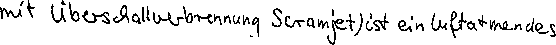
mit Überschallverbrennung Scramjet) ist ein luftatmendes
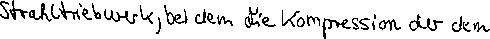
Strahltriebwerk, bei dem die Kompression der dem
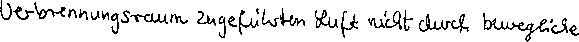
Verbrennungsraum zugeführten Luft nicht durch bewegliche
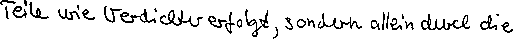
Teile wie Verdichter erfolgt, sondern allein durch die
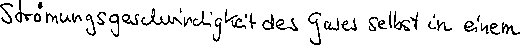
Strömungsgeschwindigkeit des Gases selbst in einem
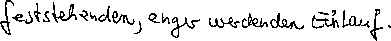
feststehenden, enger werdenden Einlauf.
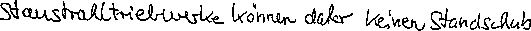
Staustrahltriebwerke können daher keinen Standschub
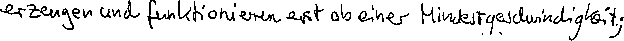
erzeugen und funktionieren erst ab einer Mindestgeschwindigkeit;
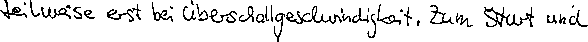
teilweise erst bei Überschallgeschwindigkeit. Zum Start und
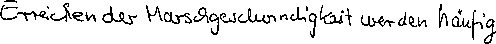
Erreichen der Marschgeschwindigkeit werden häufig
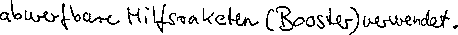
abwerfbare Hilfsraketen (Booster) verwendet.
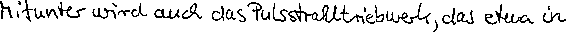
Mitunter wird auch das Pulsstrahltriebwerk, das etwa in
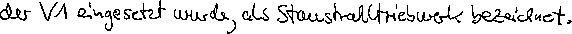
der V1 eingesetzt wurde, als Staustrahltriebwerk bezeichnet.
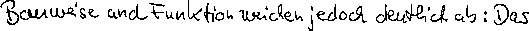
Bauweise und Funktion weichen jedoch deutlich ab: Das
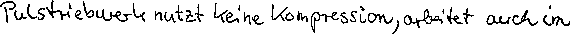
Pulstriebwerk nutzt keine Kompression, arbeitet auch im
